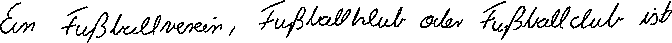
Ein Fußballverein, Fußballklub oder Fußballclub ist
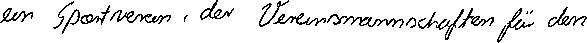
ein Sportverein, der Vereinsmannschaften für den
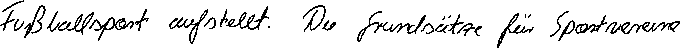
Fußballsport aufstellt. Die Grundsätze für Sportvereine
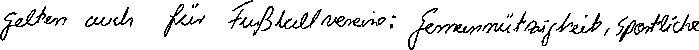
gelten auch für Fußballvereine: Gemeinnützigkeit, sportliche
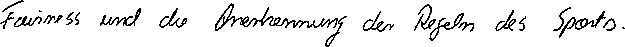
Fairness und die Anerkennung der Regeln des Sports.
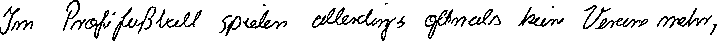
Im Profifußball spielen allerdings oftmals keine Vereine mehr,
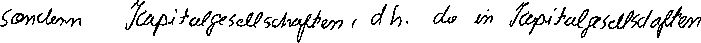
sondern Kapitalgesellschaften, d. h. die in Kapitalgesellschaften
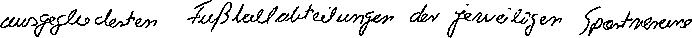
ausgegliederten Fußballabteilungen der jeweiligen Sportvereine.
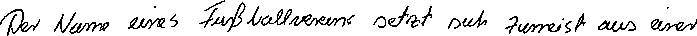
Der Name eines Fußballvereins setzt sich zumeist aus einer
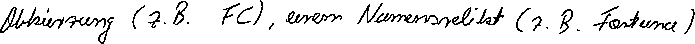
Abkürzung (z. B. FC), einem Namensrelikt (z. B. Fortuna)
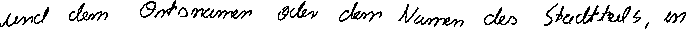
und dem Ortsnamen oder dem Namen des Stadtteils, in
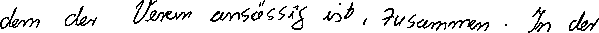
dem der Verein ansässig ist, zusammen. In der
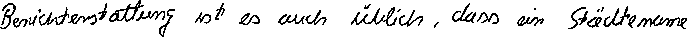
Berichterstattung ist es auch üblich, dass ein Städtename
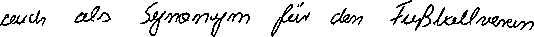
auch als Synonym für den Fußballverein
